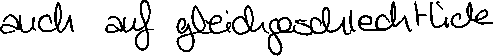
auch auf gleichgeschlechtliche
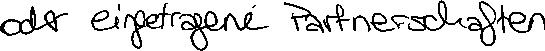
oder eingetragene Partnerschaften
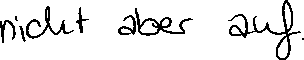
nicht aber auf
